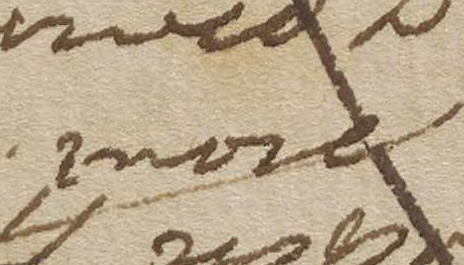more
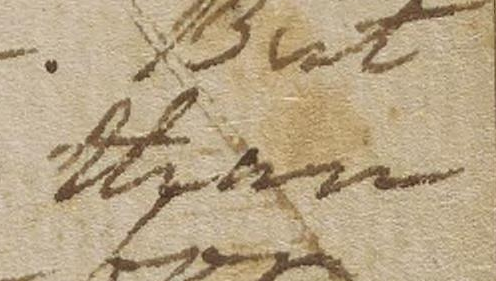than
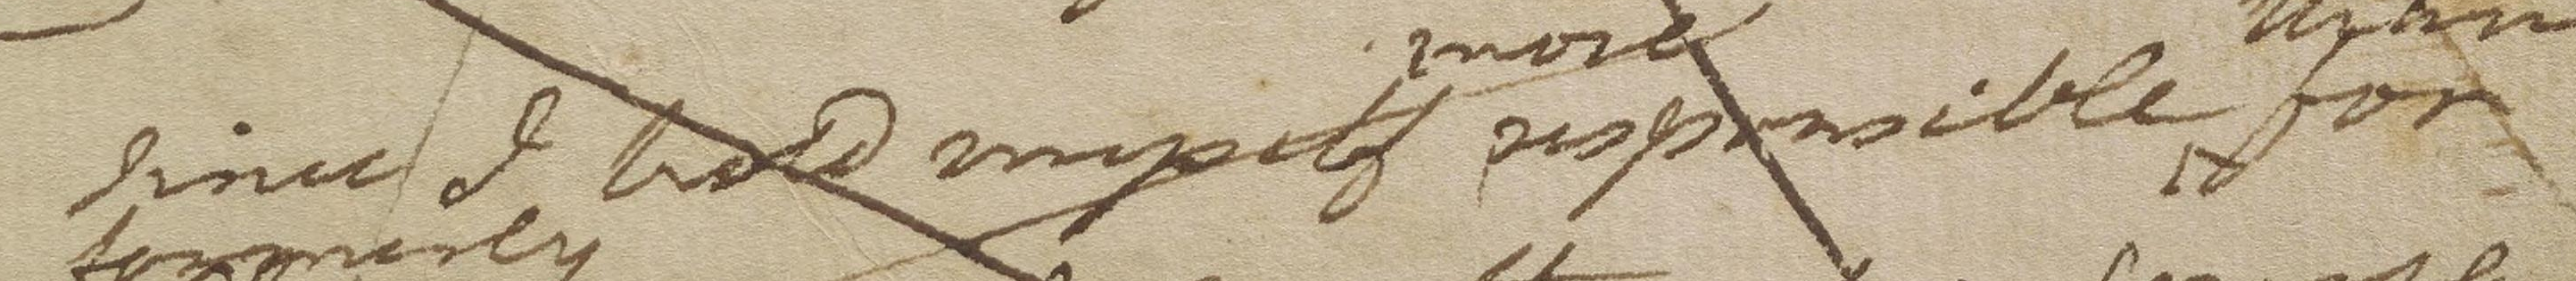since I hold myself ^ responsible ^ for
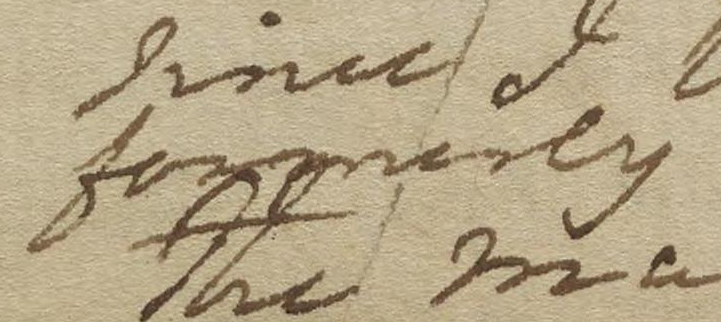formerly
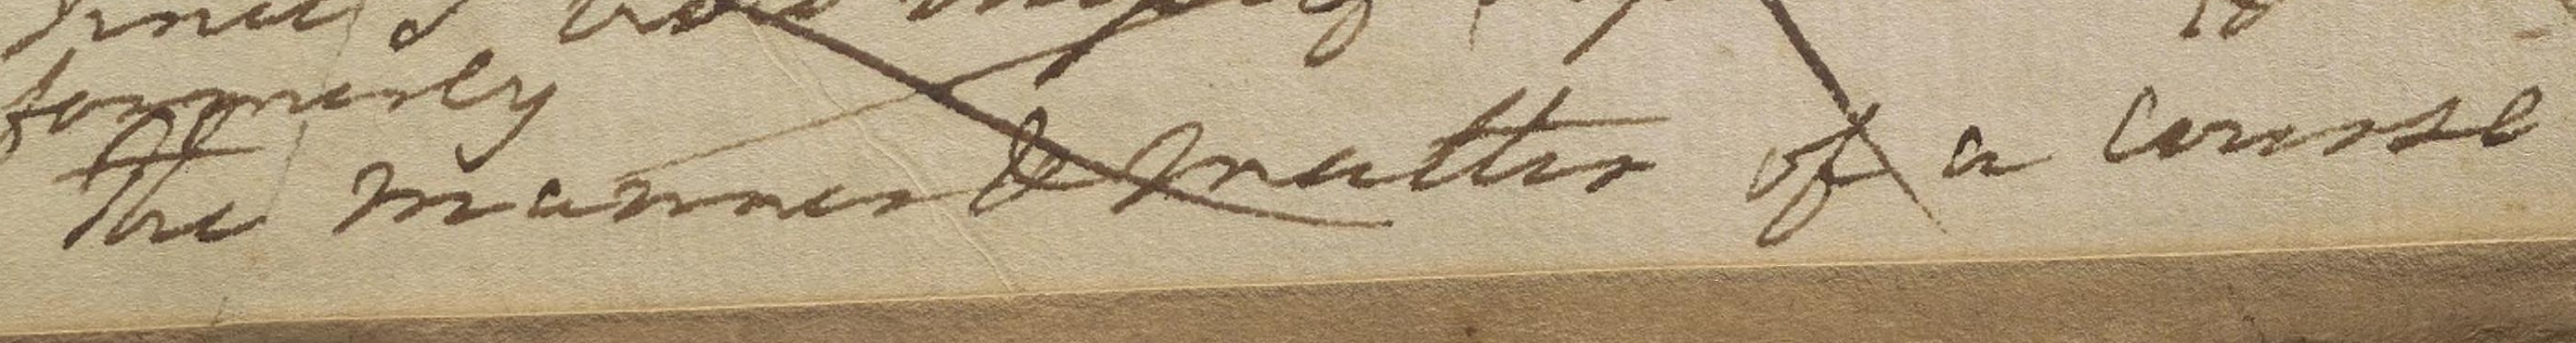The manner & matter of a cause
